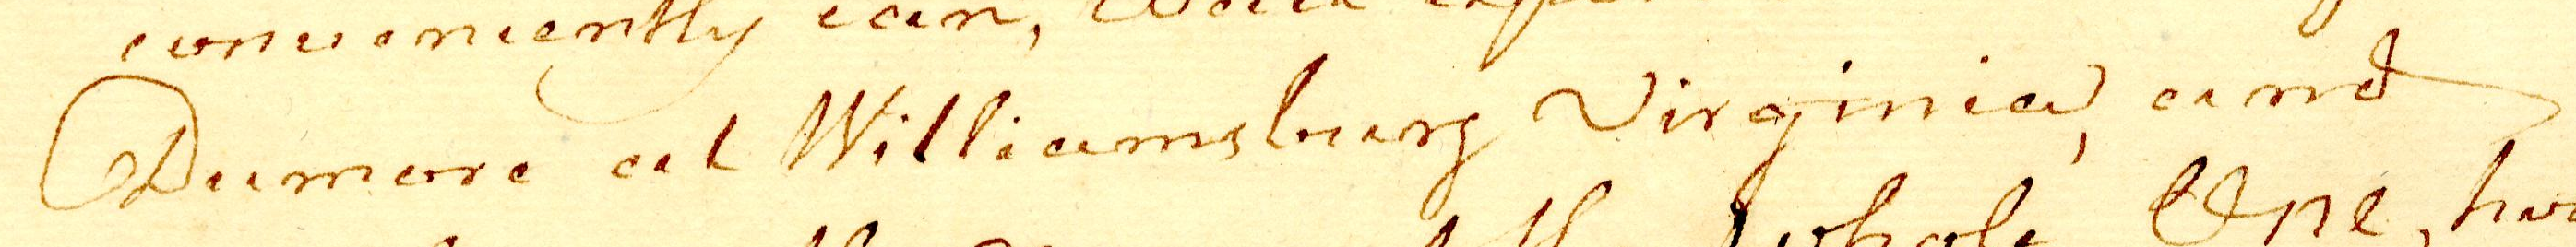Dumore at Williamsburg Virginia, and
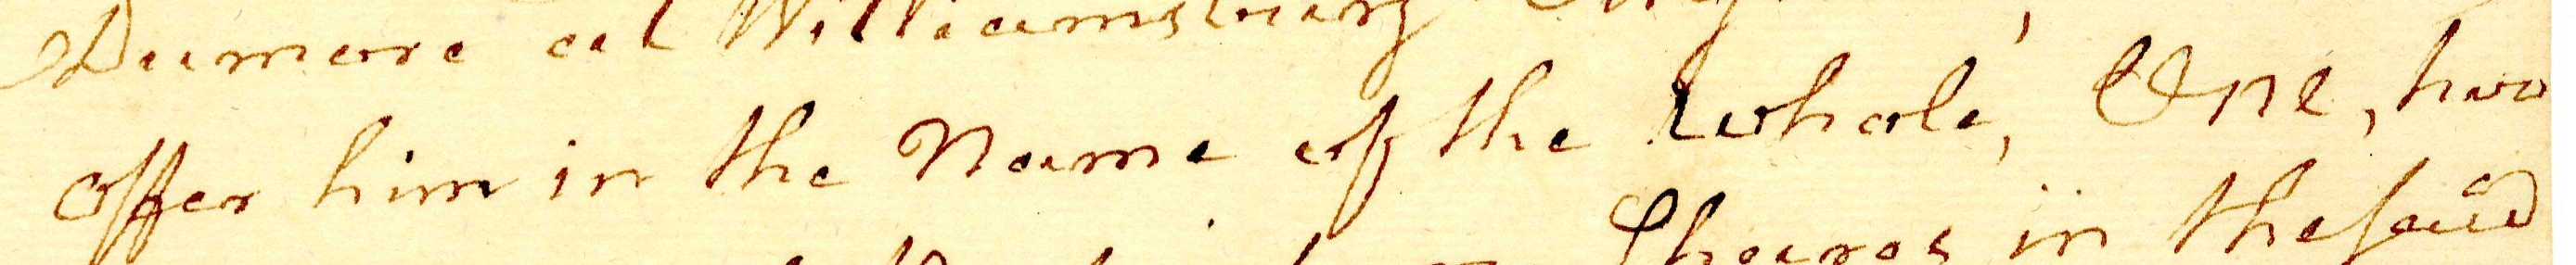Offer him in the Name of the whole, one, two
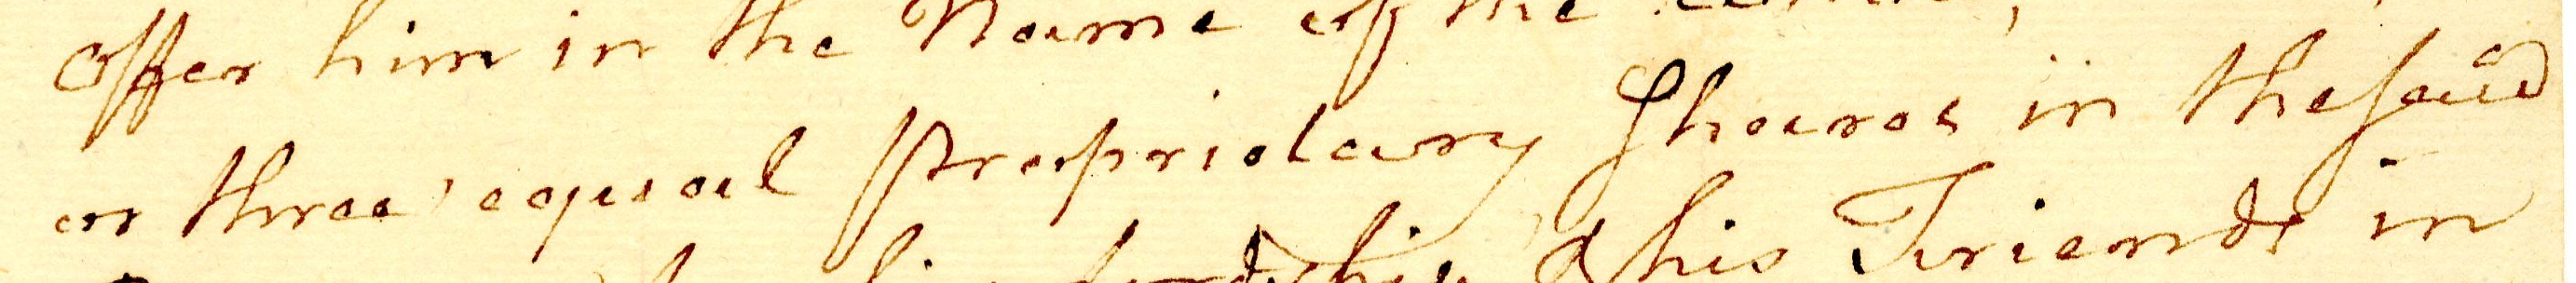-er three equal proprietary Shares in the said
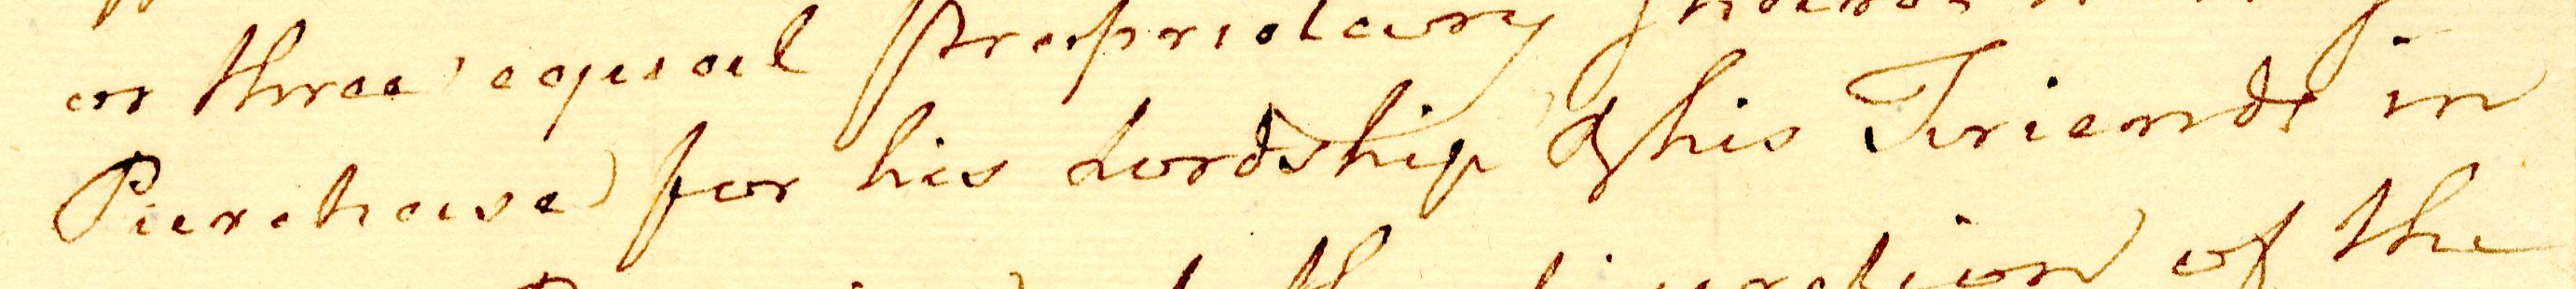Purchase for his lordship & his Friends in
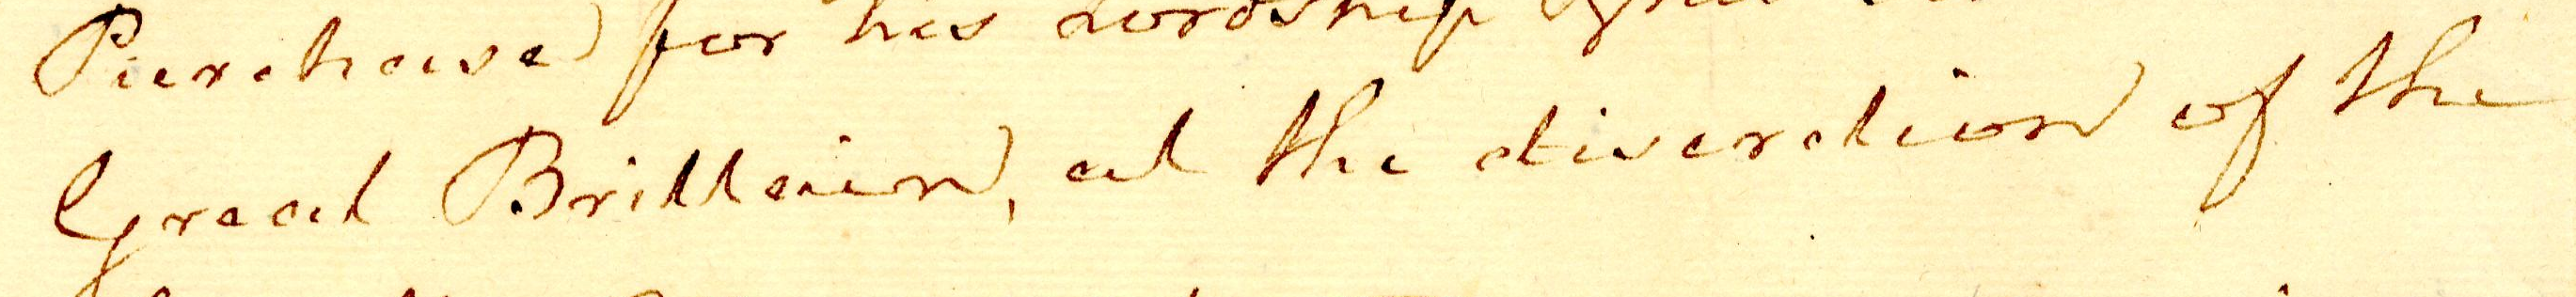Great Brittian at the discretion of the
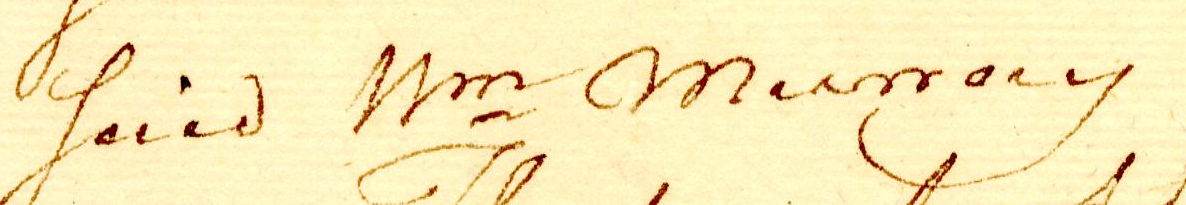said W^m Murray
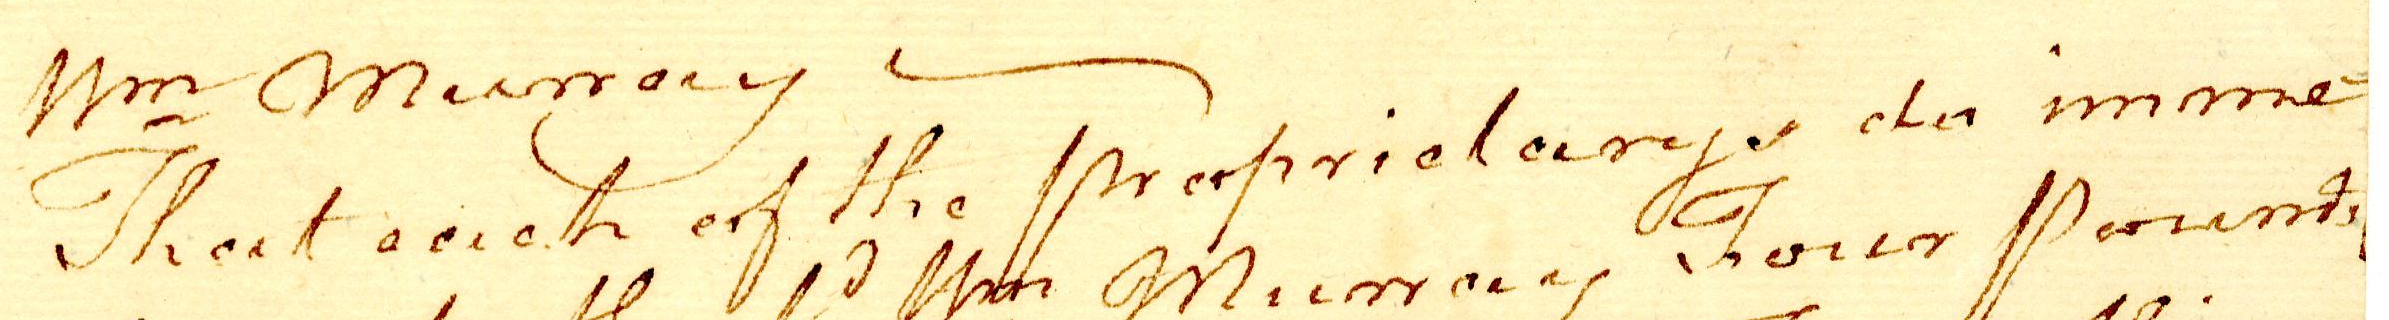That each of the proprietary's do imme-
